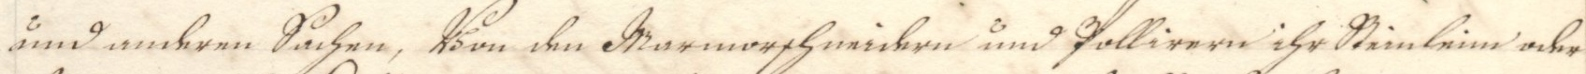und anderen Sachen, Von den Marmorschneidern und Pollirern ihr Steinleim oder
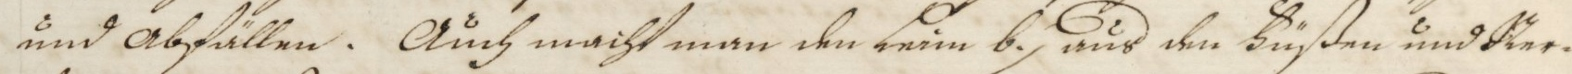und Abfällen. Auch macht man den Leim b. aus den Füßen und Ner-
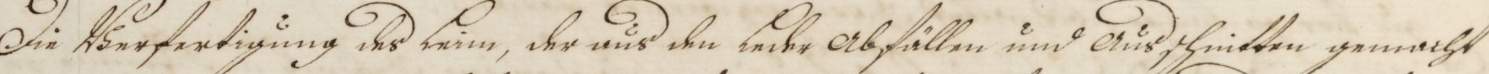Die Verfertigung des Leim, der aus den Leder Abfällen und Ausschnitten gemacht
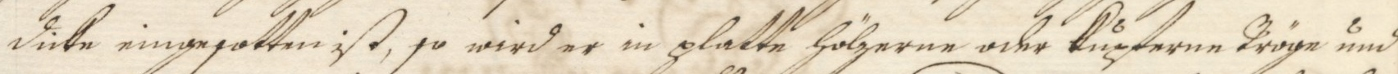dicke eingesotten ist, so wird er in platte hölzerne oder kurterne Tröge und
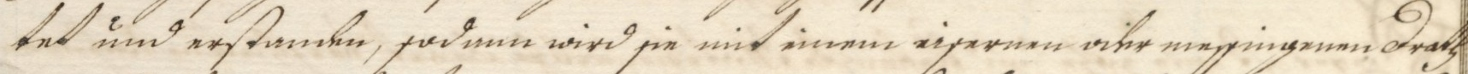tet und erstanden, sodann wird sie mit einem eisernen oder messingenen Drath
